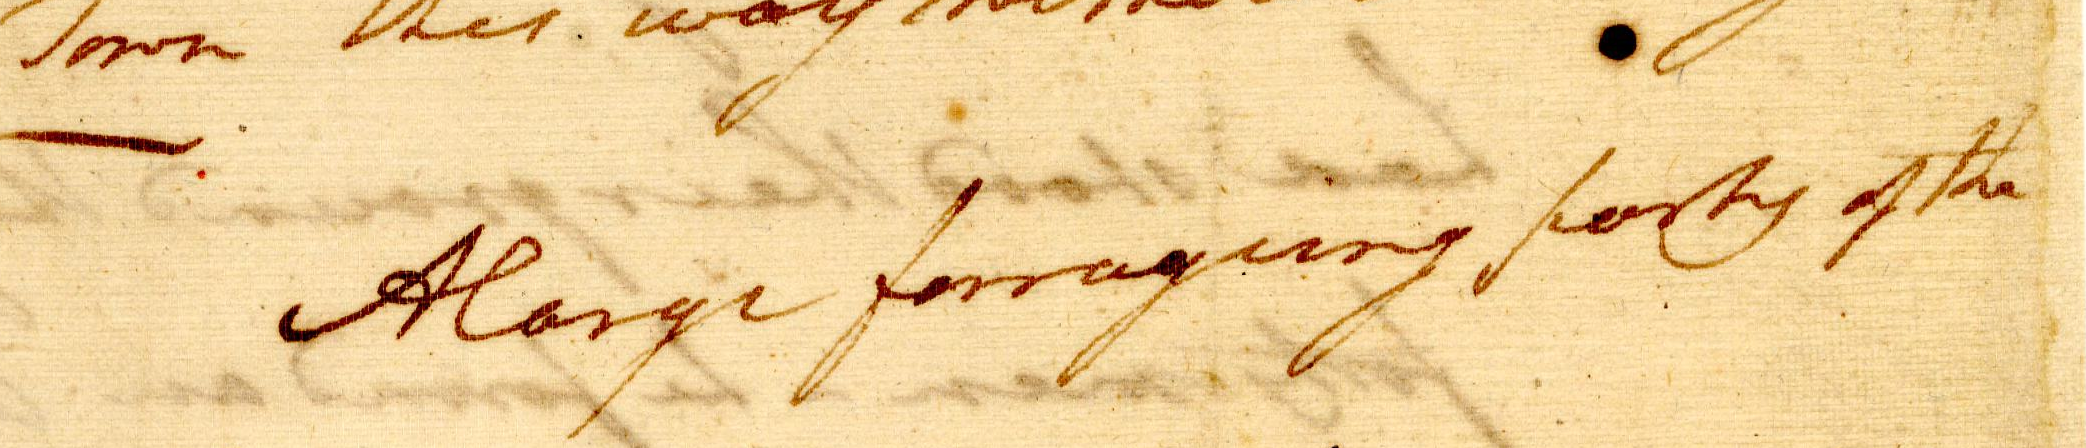A large forraging party of the
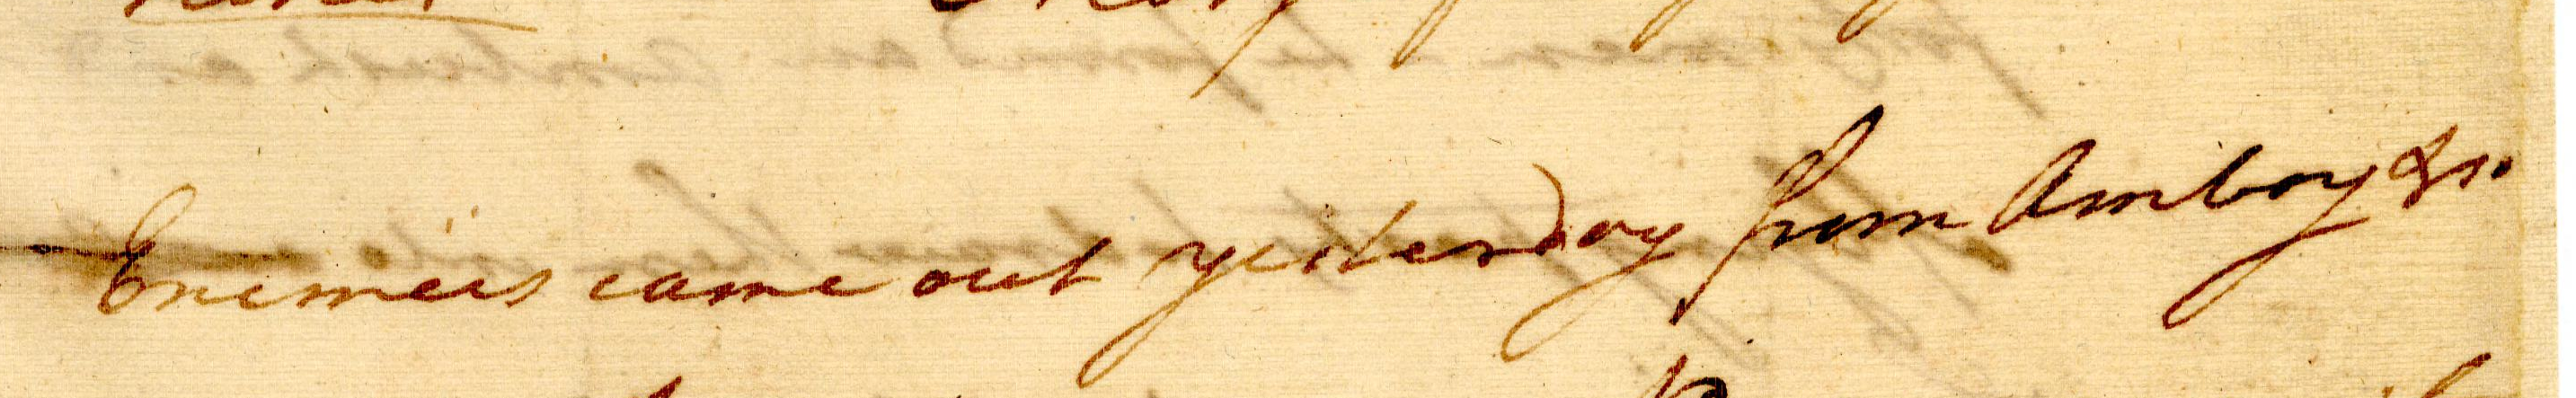Enemies came out yesterday from Amboy &
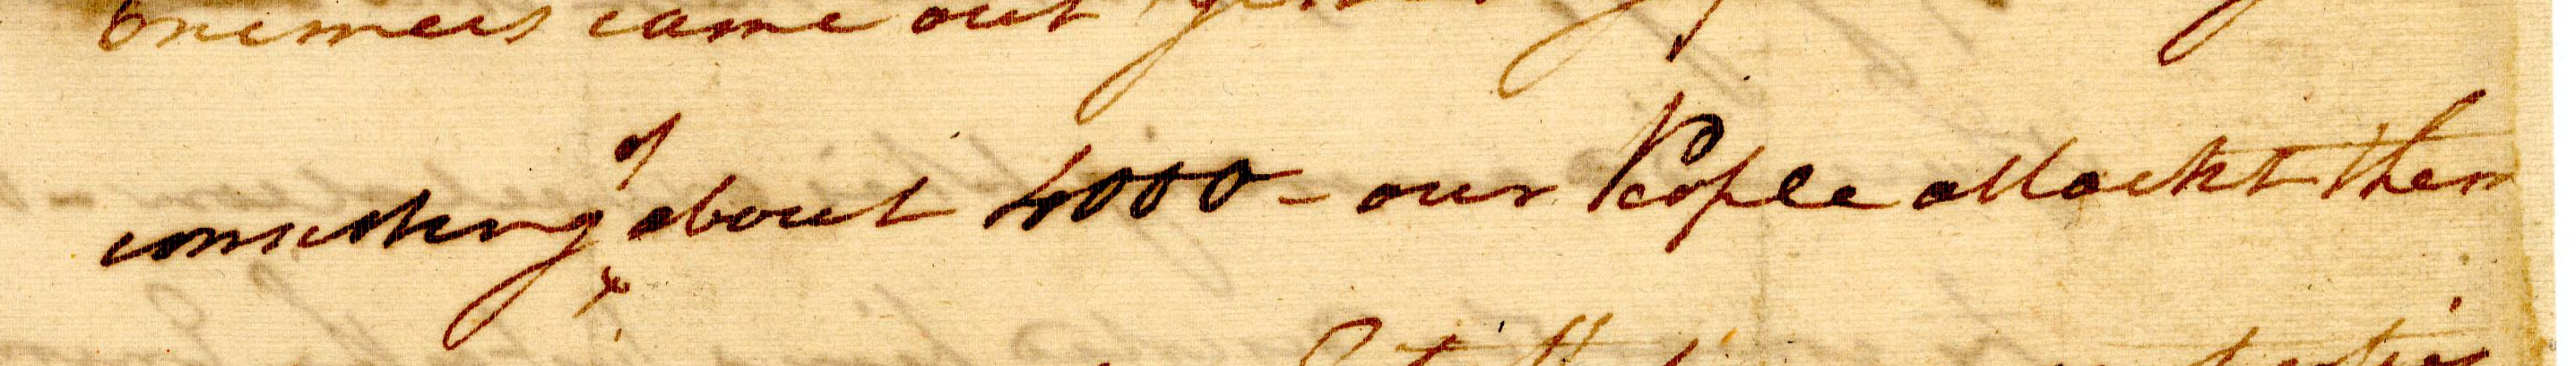consisting ^ about 4000- our People attackt them
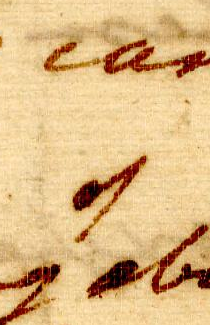of
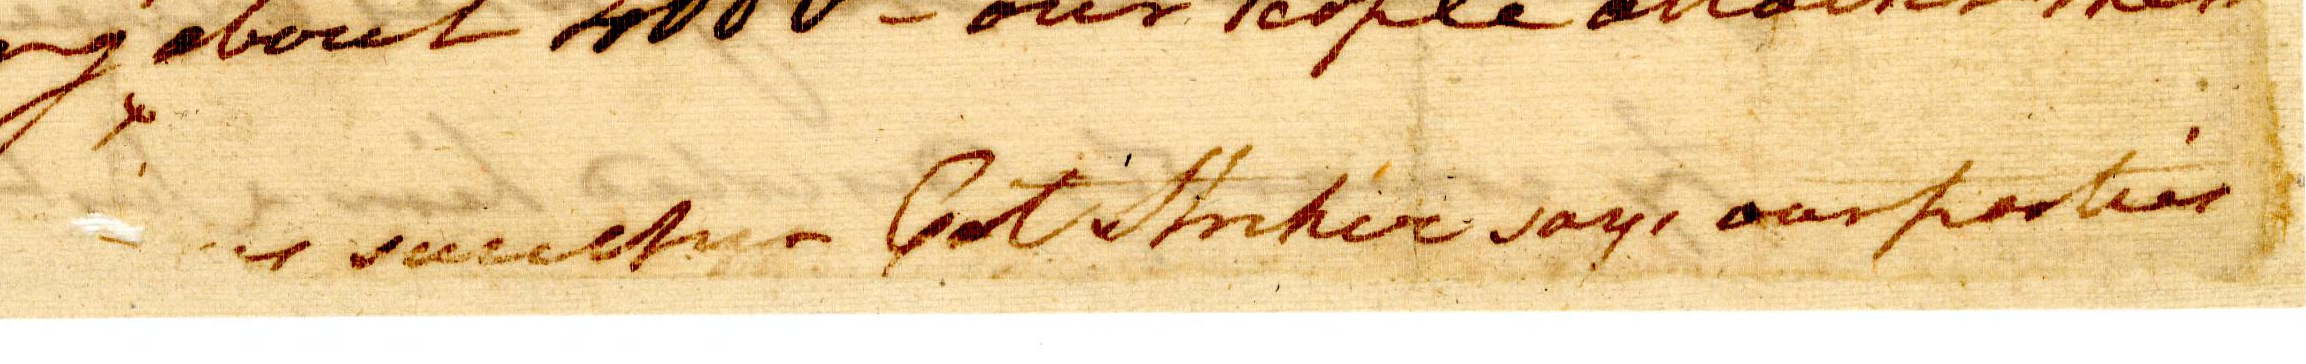sucess- Col Striker says our parties
